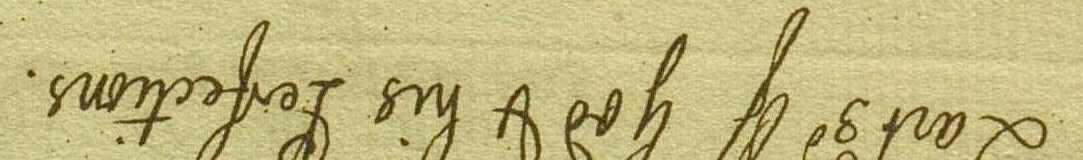Part 3^d Of God & his Perfections.
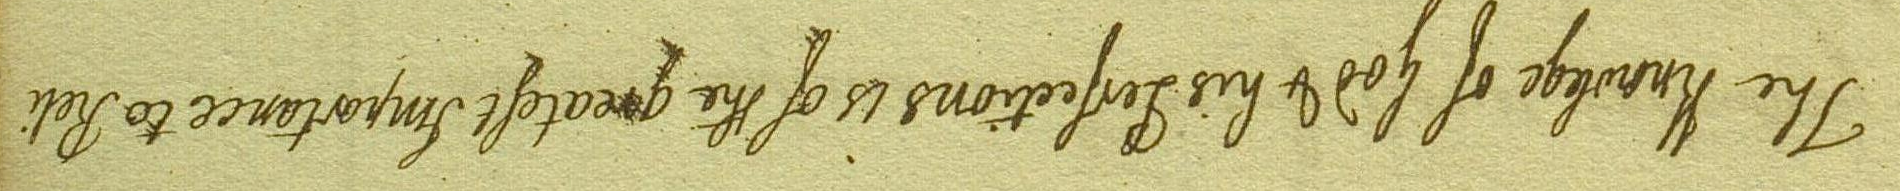The Knowlege of God & his Perfections is of the greatest Importance to Reli
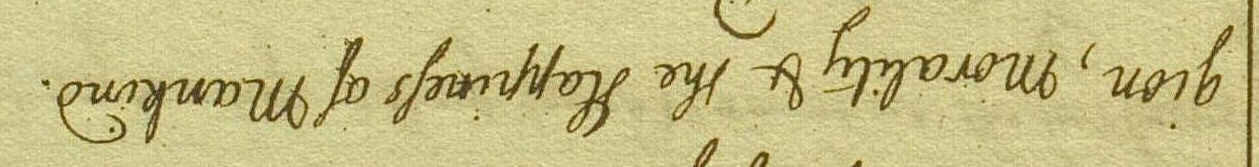gion, morality & the Happiness of Mankind.
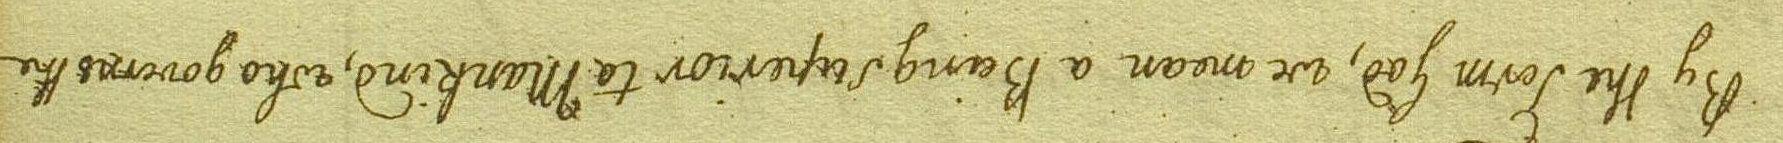By the Form God, we mean a Being superior to Mankind, who governs the
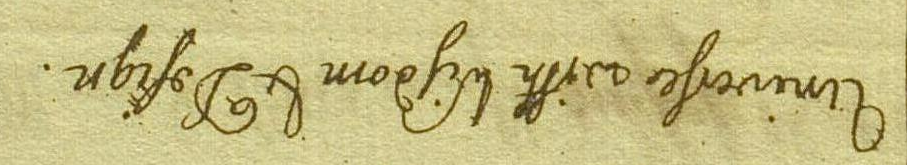Universe with Wisdom & Design.
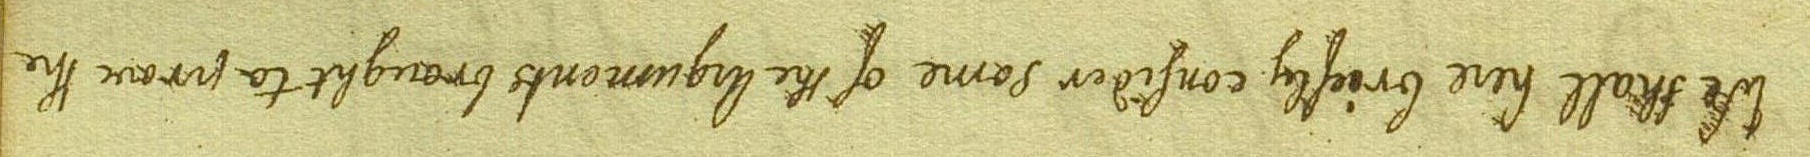We shall here briefly consider some of the Arguments brought to prove the
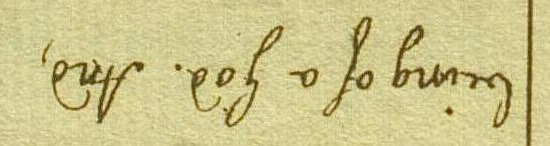being of a God. And,
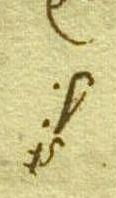1^st:
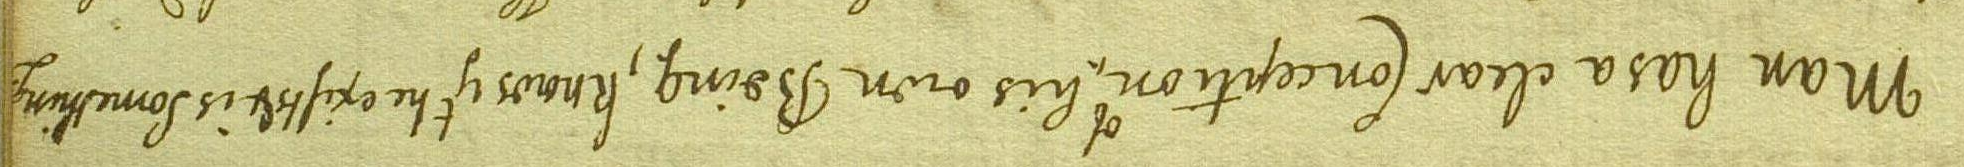Man has a clear Conception ^of his own Being, knows y^t he exists & is Something.
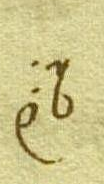2^d:
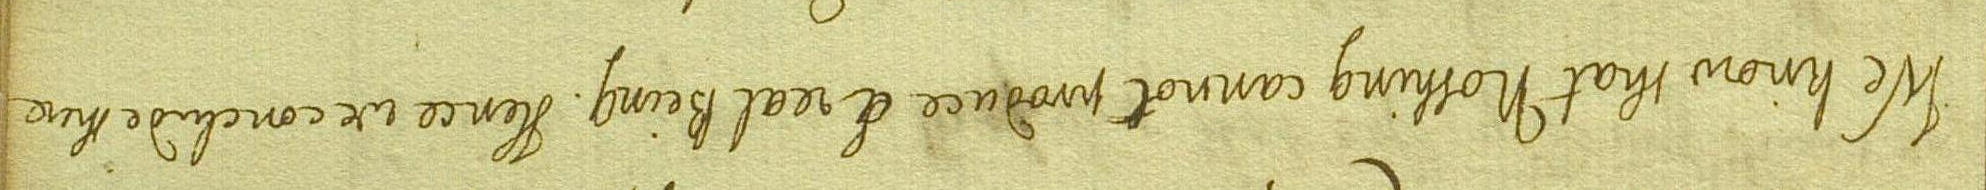We know that Nothing cannot produce a real Being. Hence we conclude there
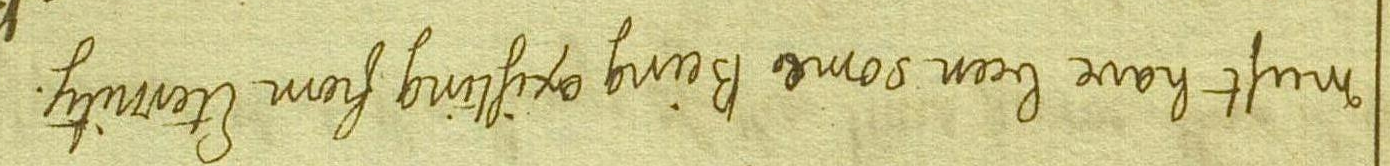must have been some Being existing from Eternity.
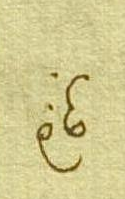3^d:
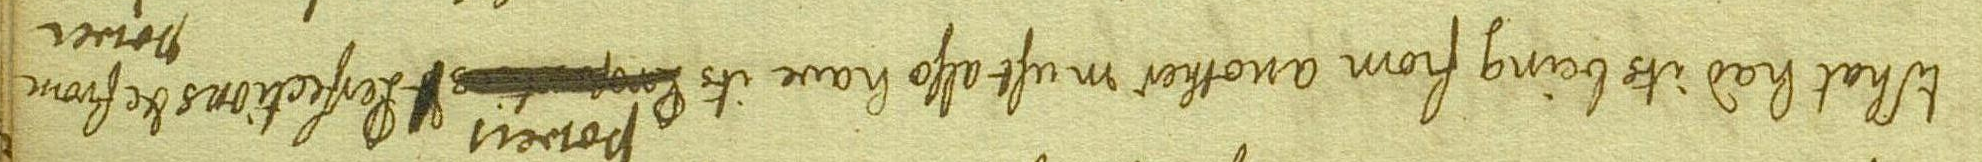What had its being from another must also have its [Properties] & Perfections &c from
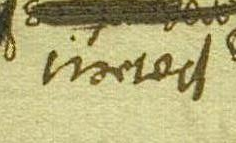powers
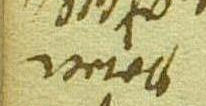power
